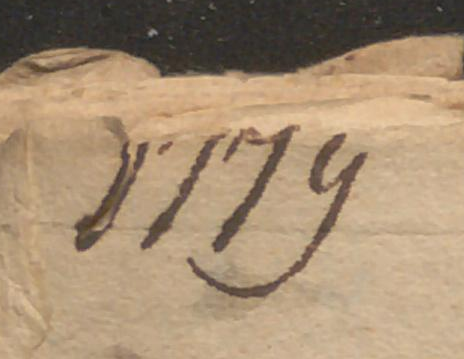1779
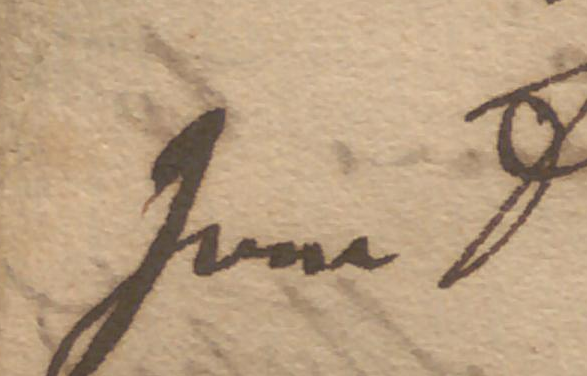June
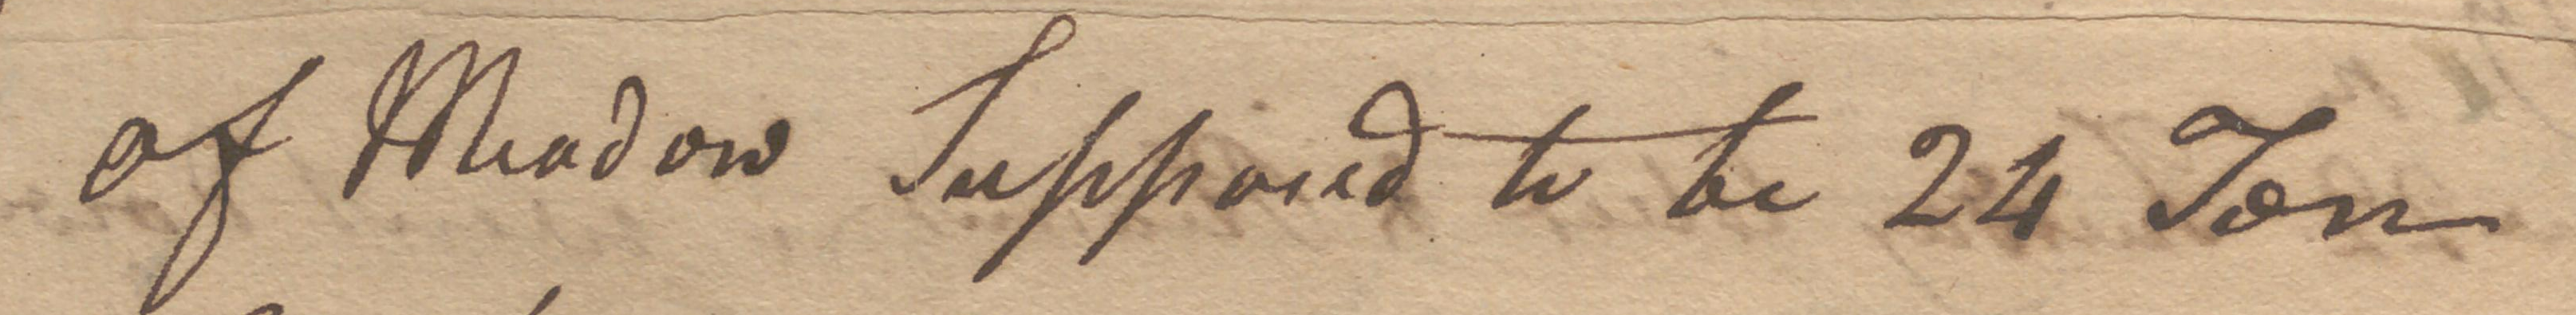of Meadow Supposed to be 24 Ton
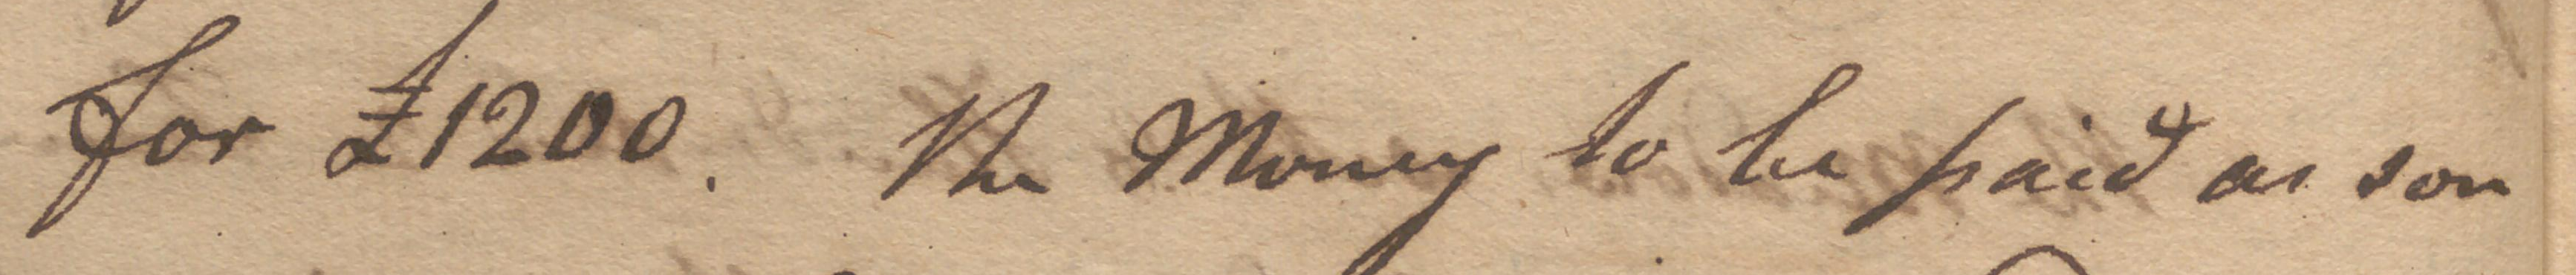for £1200. the Money to be paid as son
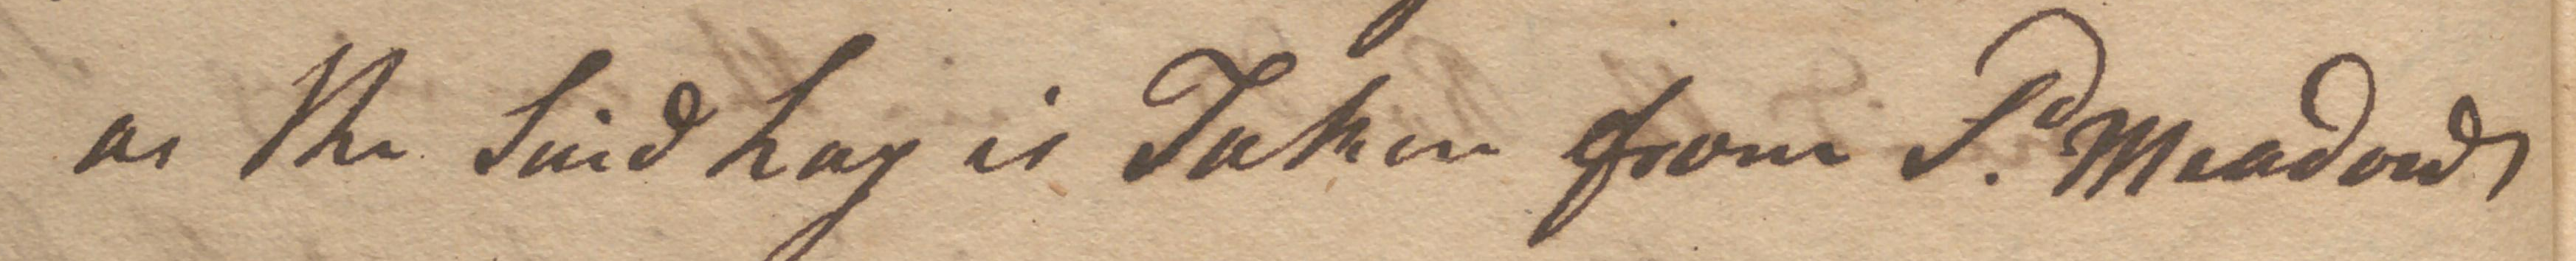as the said hay is Taken from s^d. Meadows
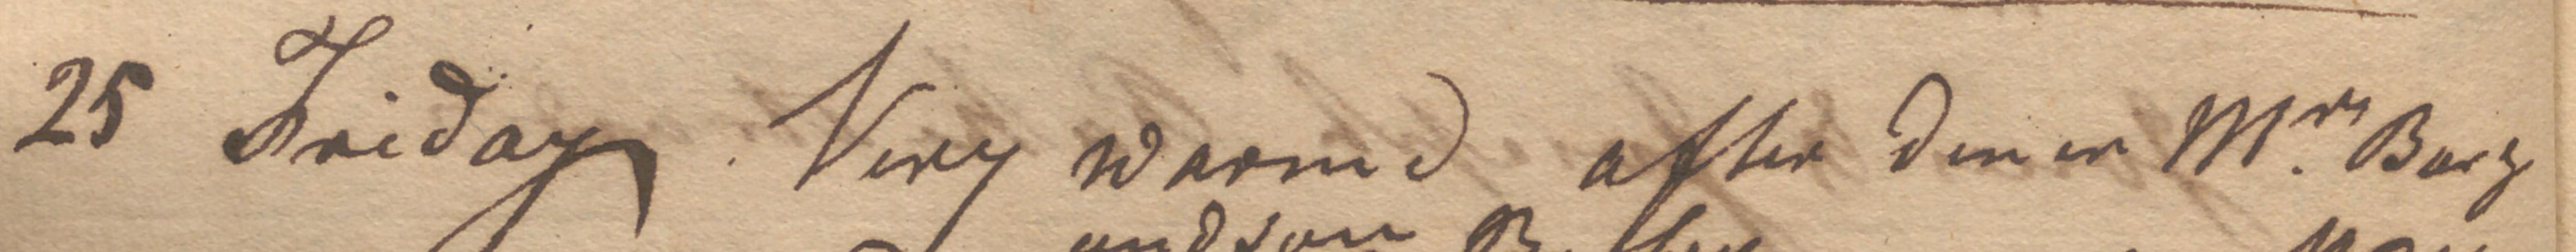25 Friday Very warme after diner M^rs. Barg
